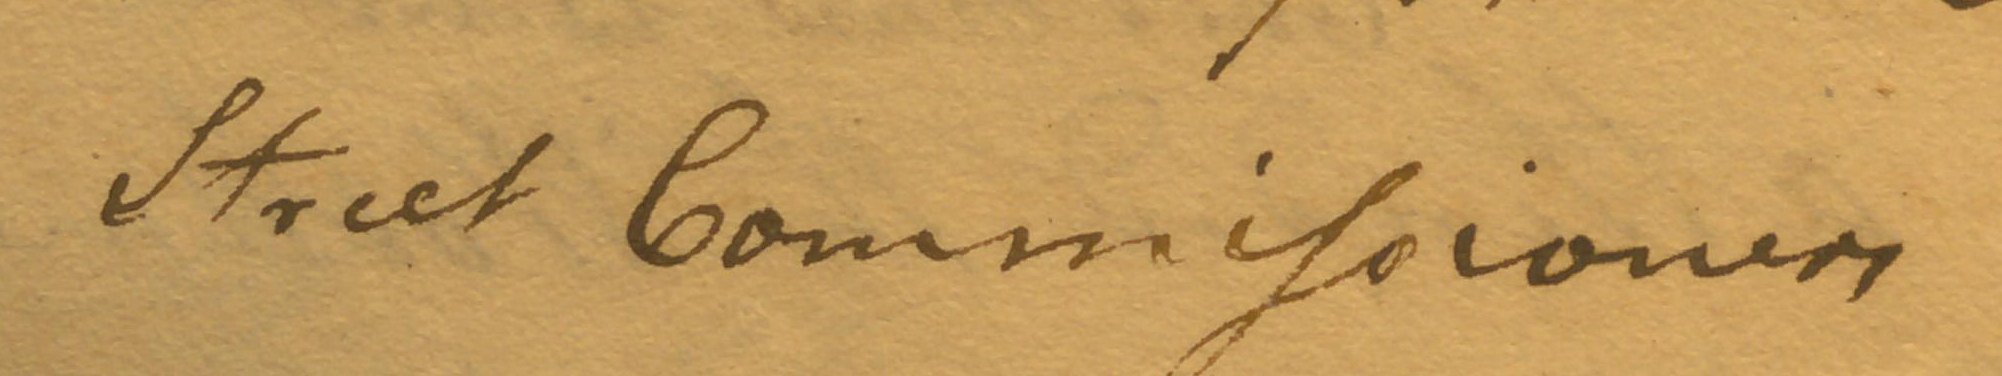Street Commissioners
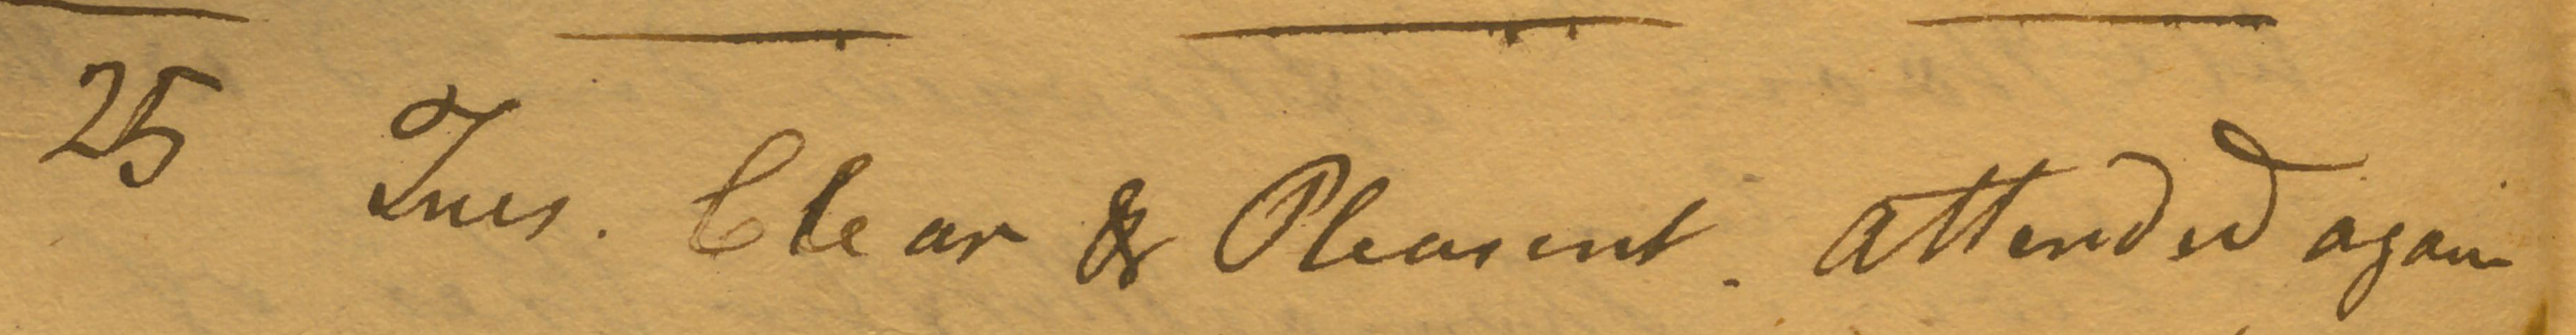25 Tues. Clear & Pleasent attended again
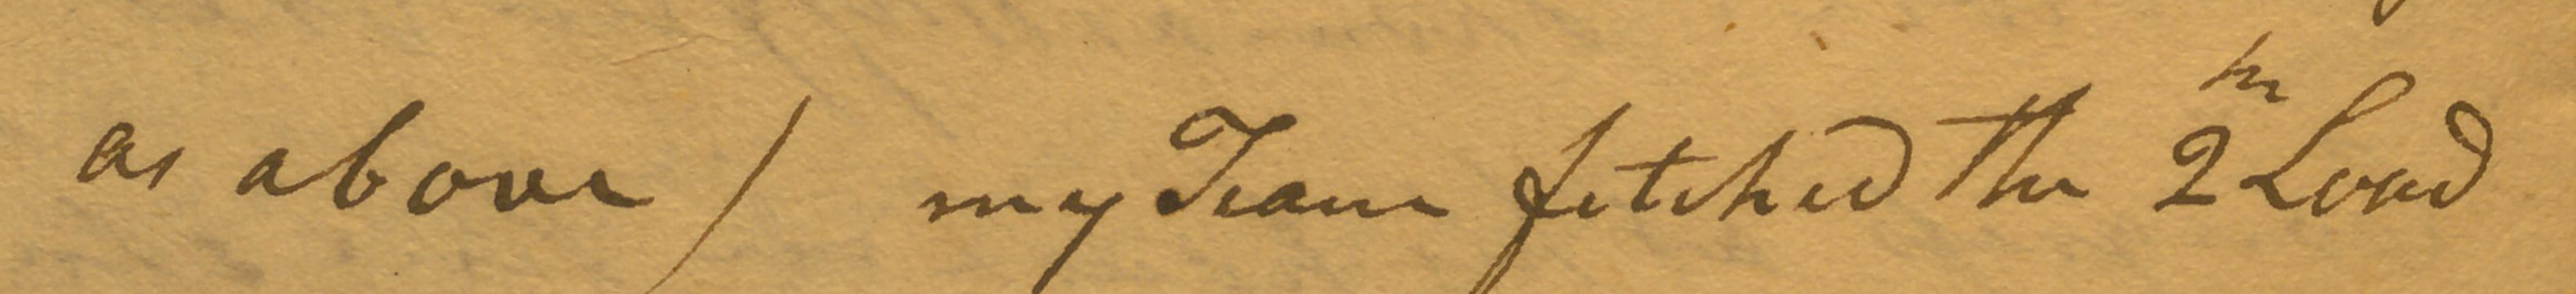as above / my Team fetched the 2^th Load
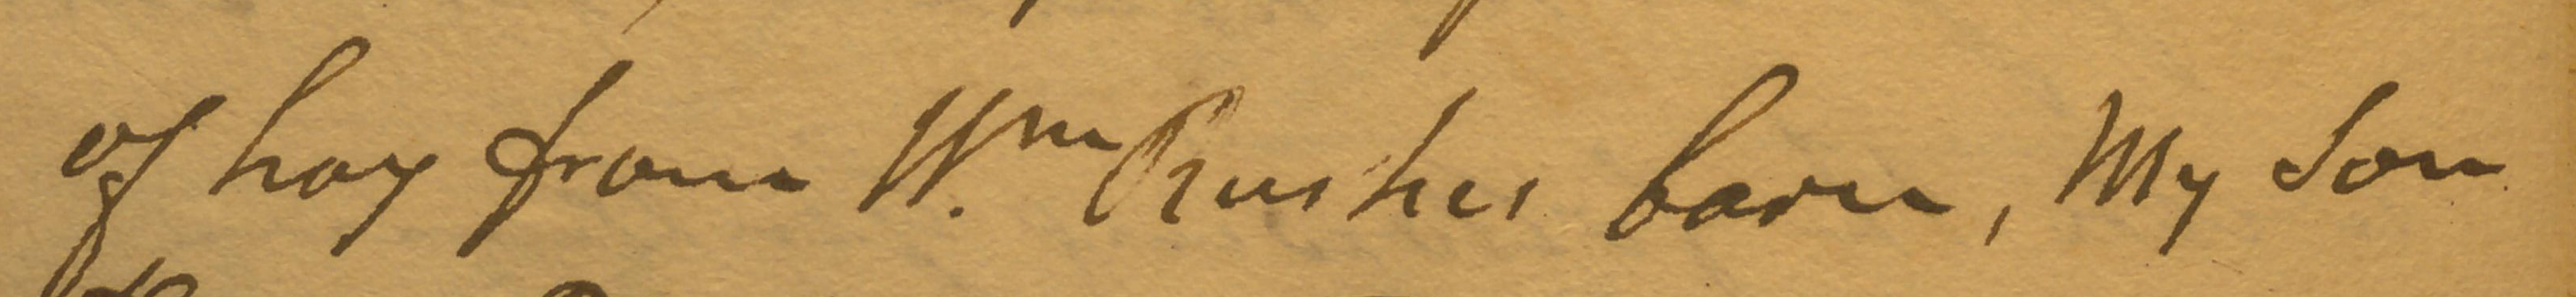of hay from W^m. Rushes barn, My Son
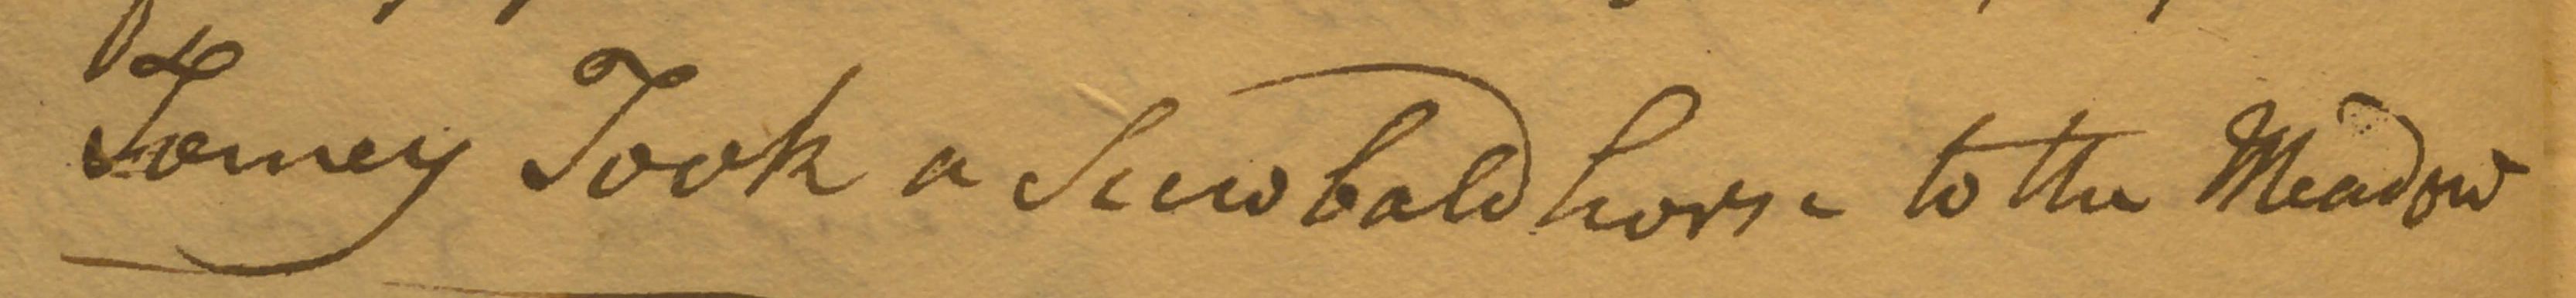Tomey Took a Seewbald horse to the Meadow
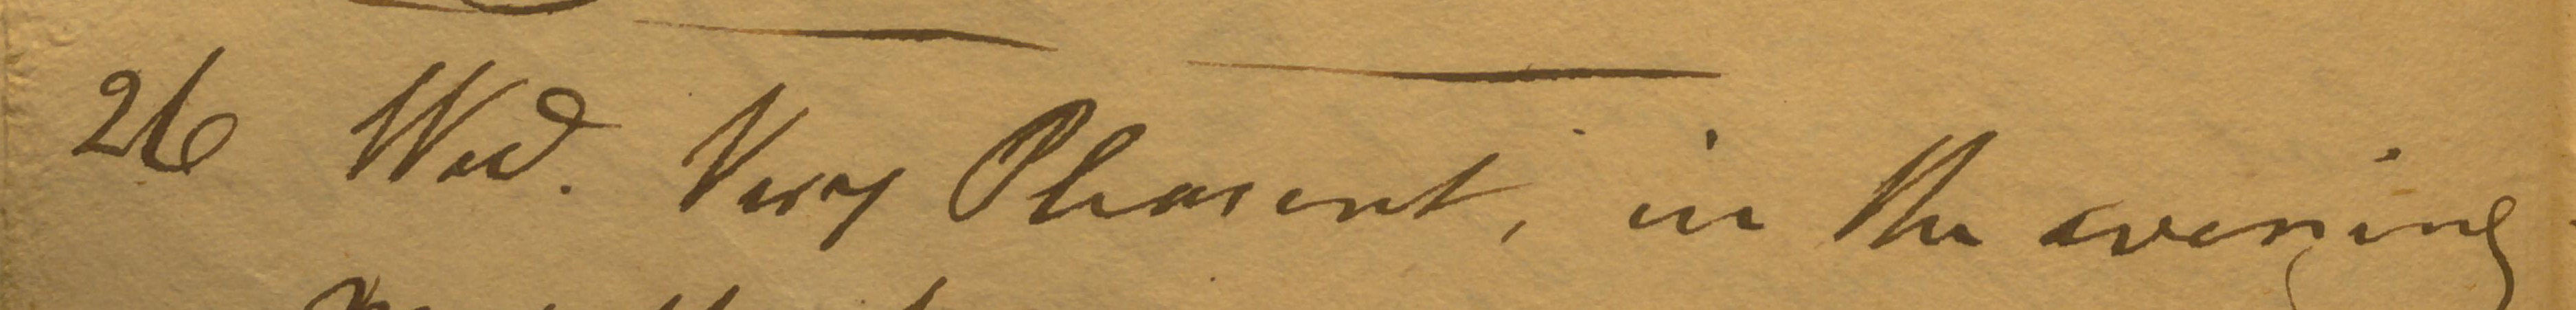26 Wed. Very Pleasent, in the evening
